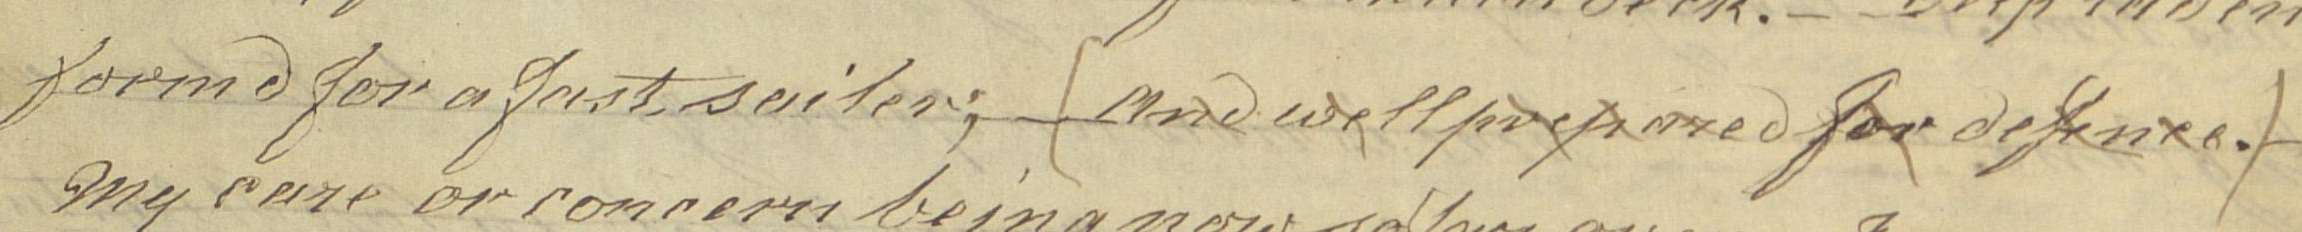formd for a fast sailer; (And well prepared for defence.)
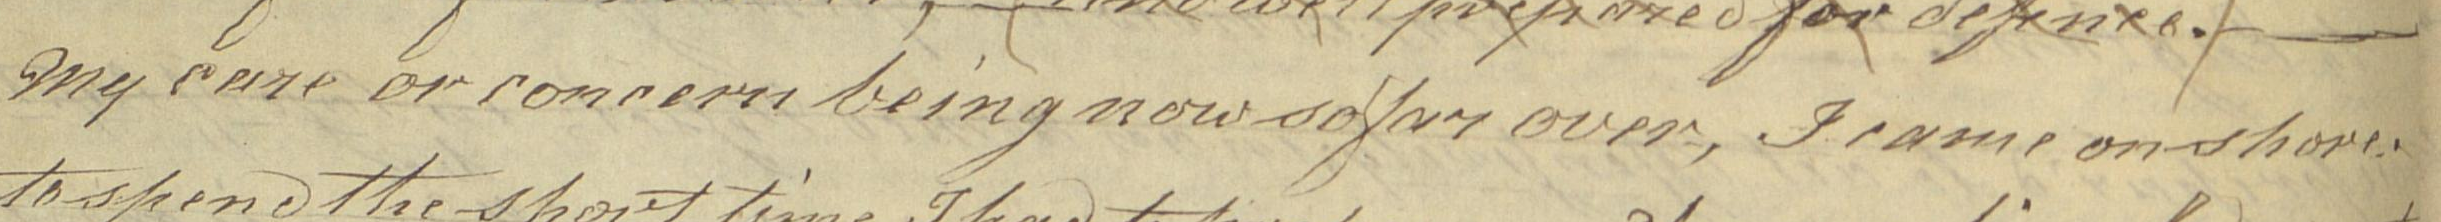my care or concern being now so far over, I came on shore
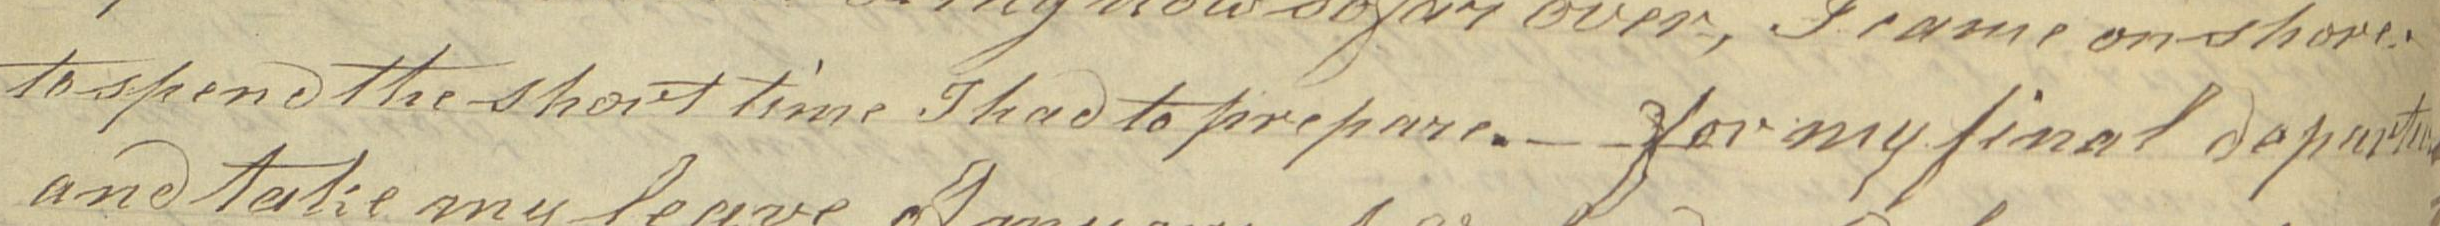to spend the short time I had to prepare.- for my final departure
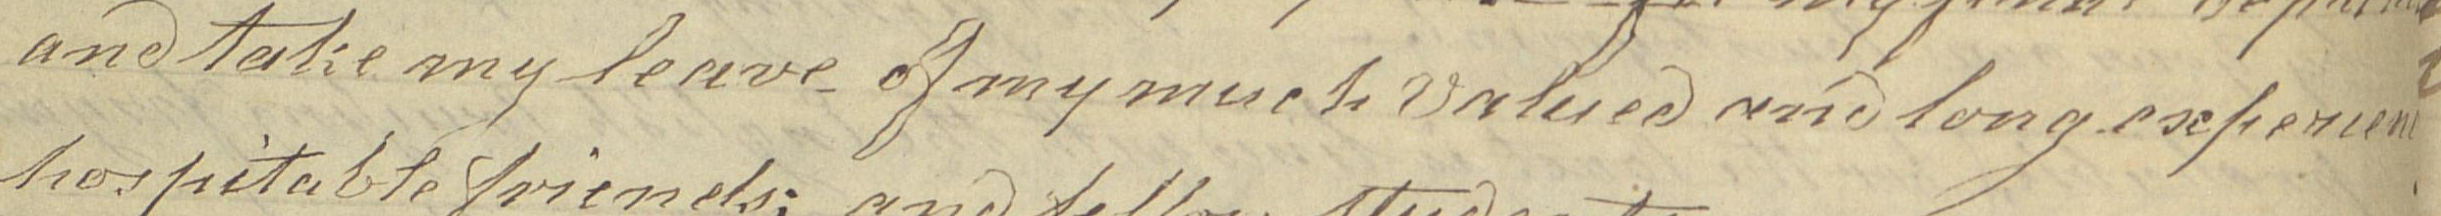and take my leave of my much valued and long experience
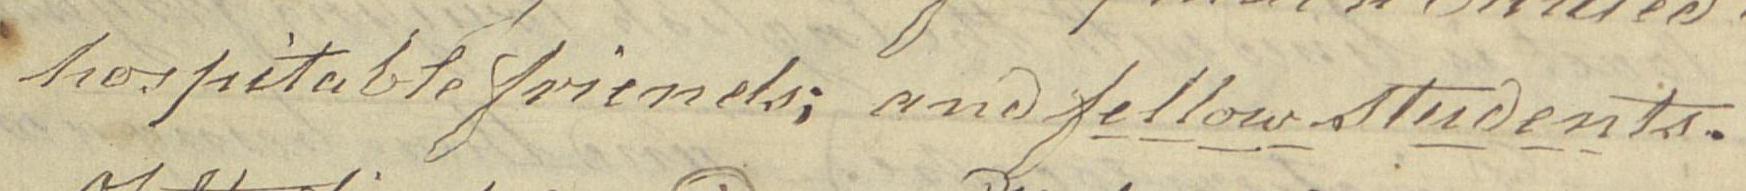hospitable friends; and fellow students.
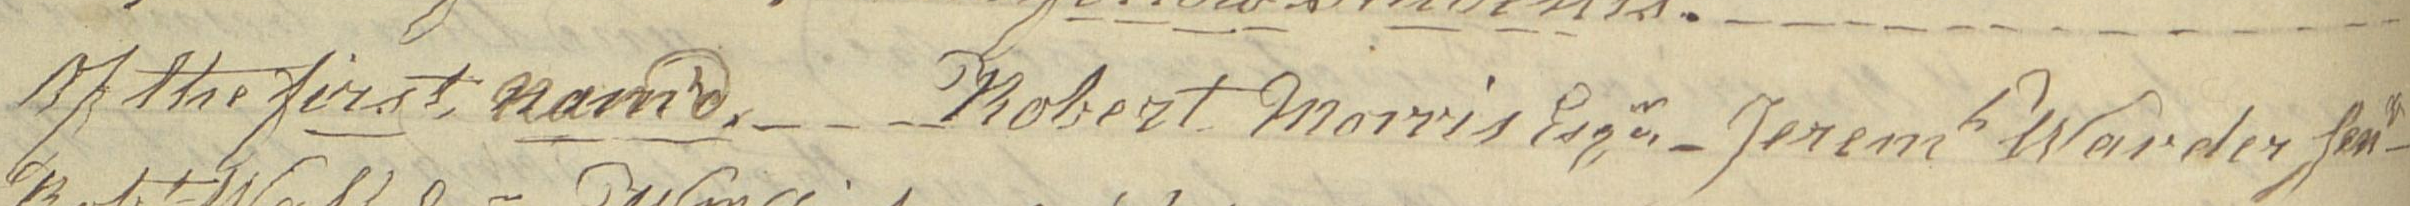of the first nam'd.-- Robert Morris Esq^r. Jerem^h Warder Sen^r
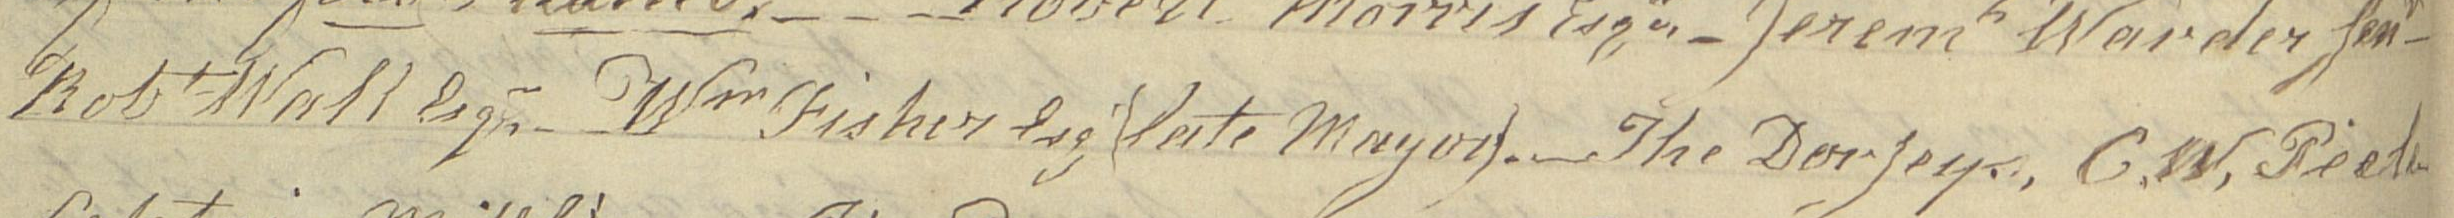Rob^t Wall Esq^r. Fisher Esq^r (late Mayor).- The Dorsey, CW. Peele
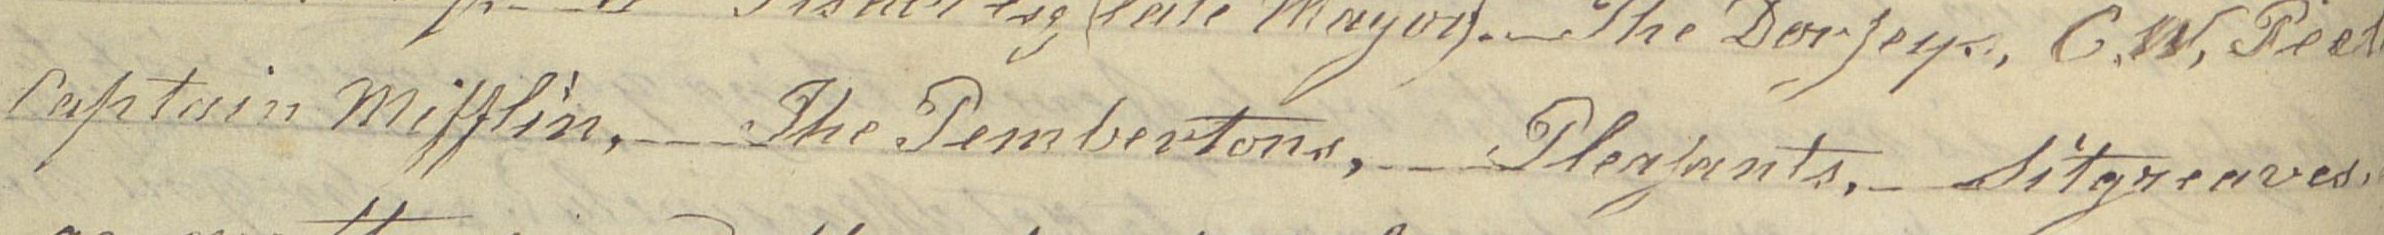Captain Mifflin. The Pembertons, Pleasants, Sitgreaves, &
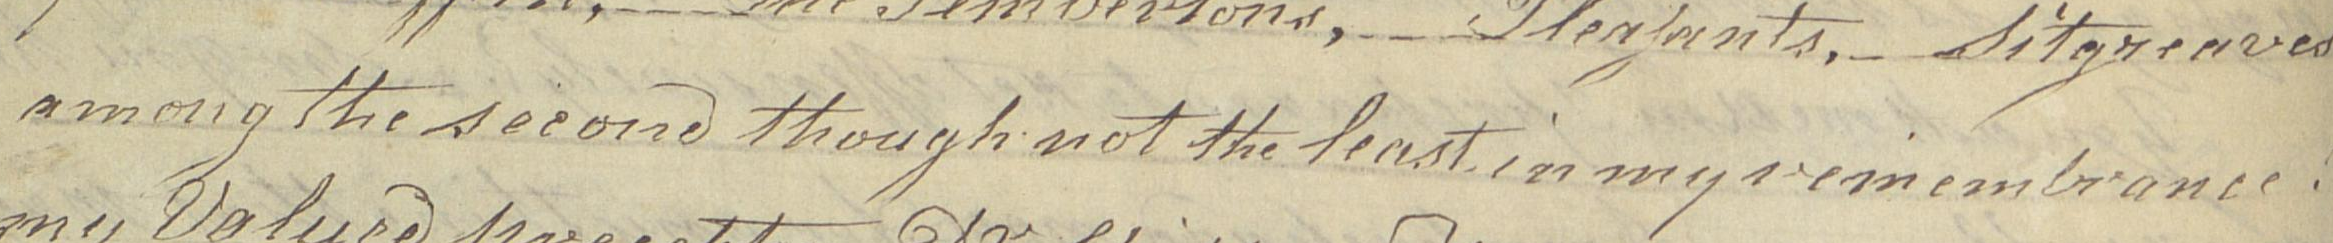among the second though not the least in my remembrance I n-
